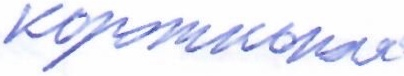короткопая
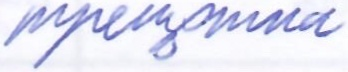трещотка
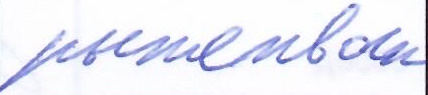рыжехвоск
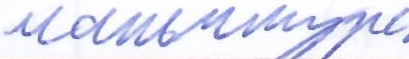маньчжурс
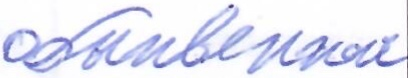обыквенная
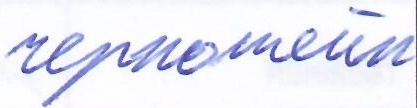черношейн
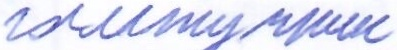гамтучник
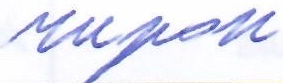чирок
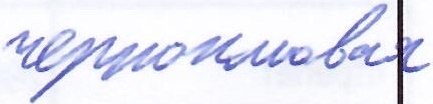черноклювая
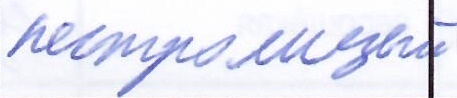пестролицый
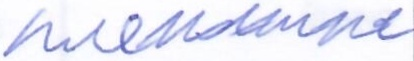пленашка
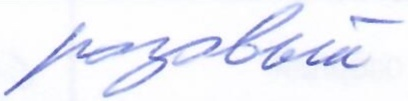розовый
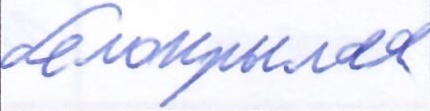белокрылая
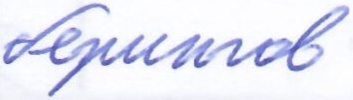берингов
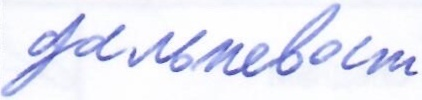дальневост
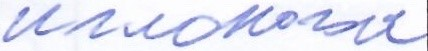иглоногая
